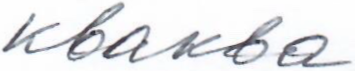кваква
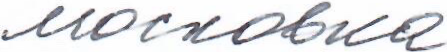московка
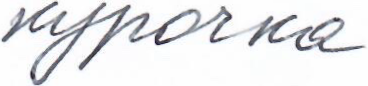курочка
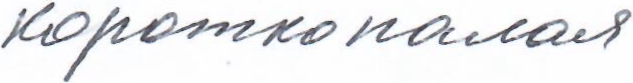короткопалая
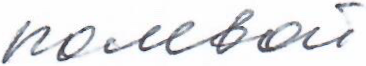полевой
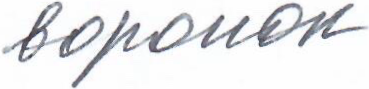воронок
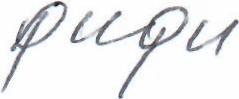фифи
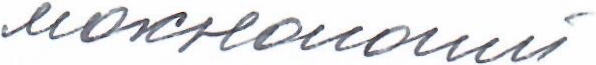мохноногий
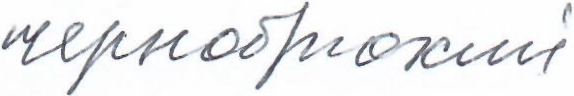чернобрюхий
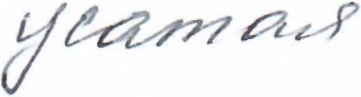усатая
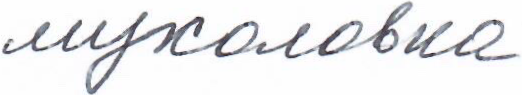мухоловка
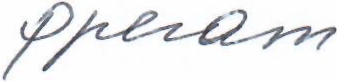фрегат
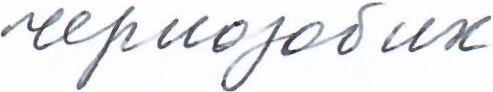чернозобик
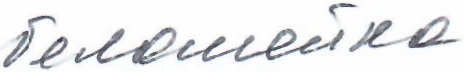белошейка
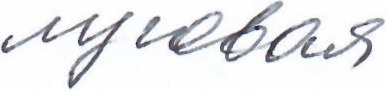луговая
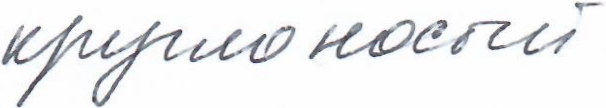круглоносый
